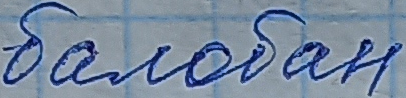балобан
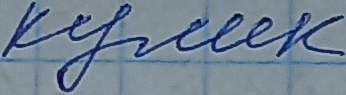кулик
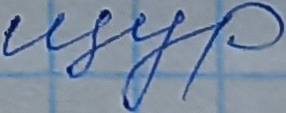щур
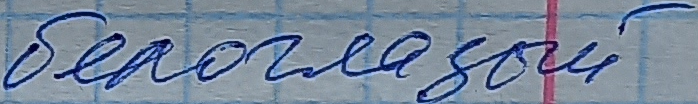белоглазый
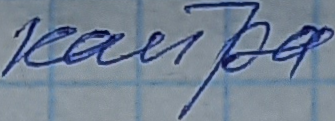кайра
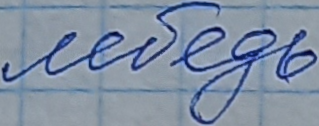лебедь
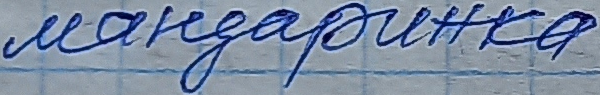мандаринка
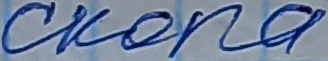скопа
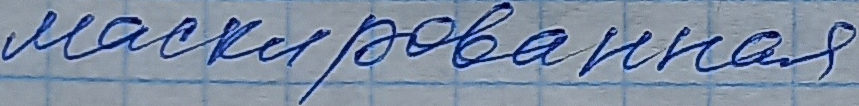маскированная
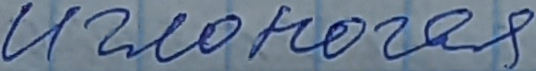иглоногая
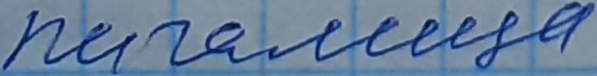пигалица
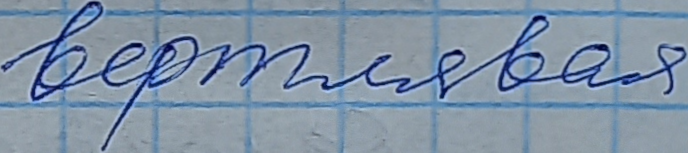вертлявая
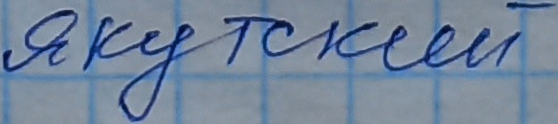якутский
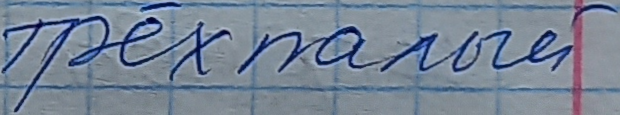трёхпалый
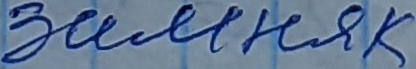зимняк
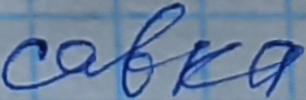савка
